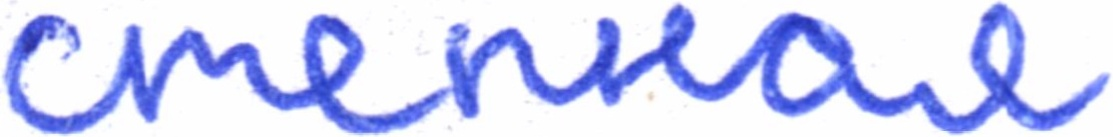степная
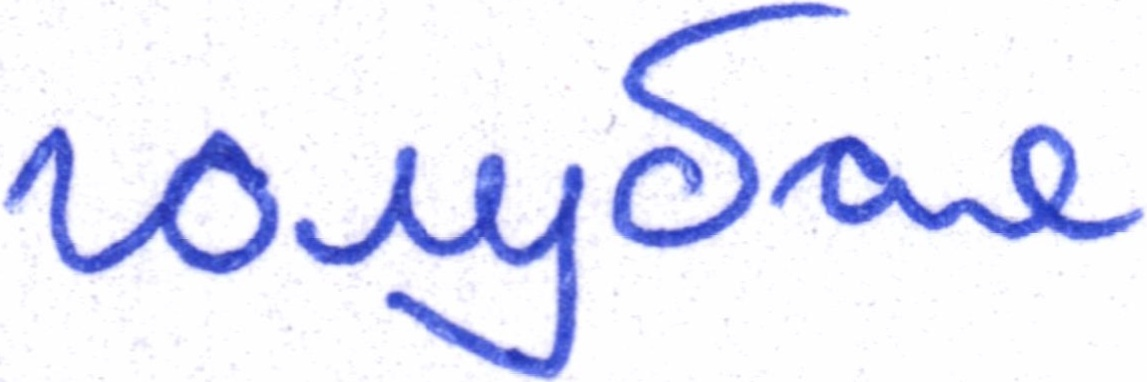голубая
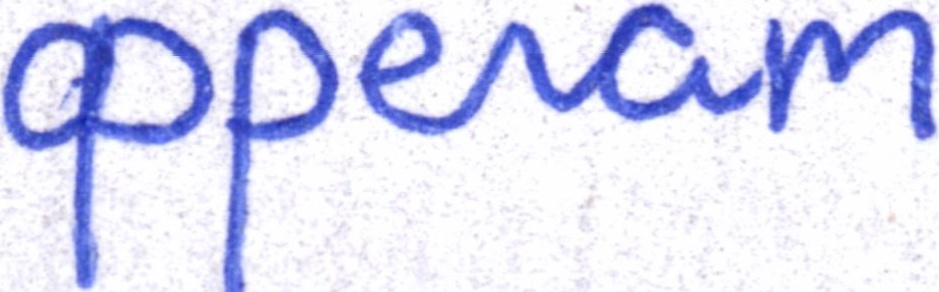фрегат
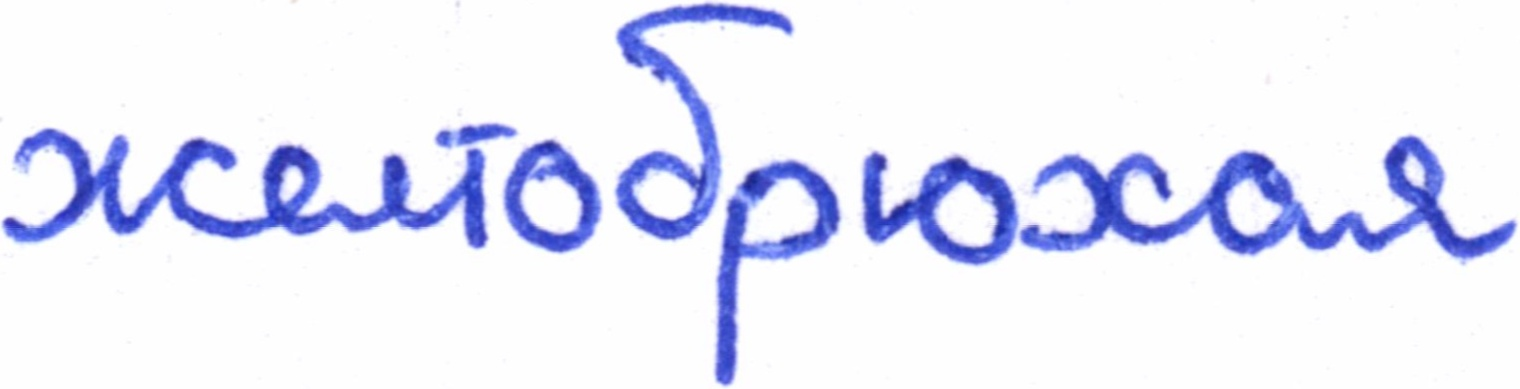желтобрюхая
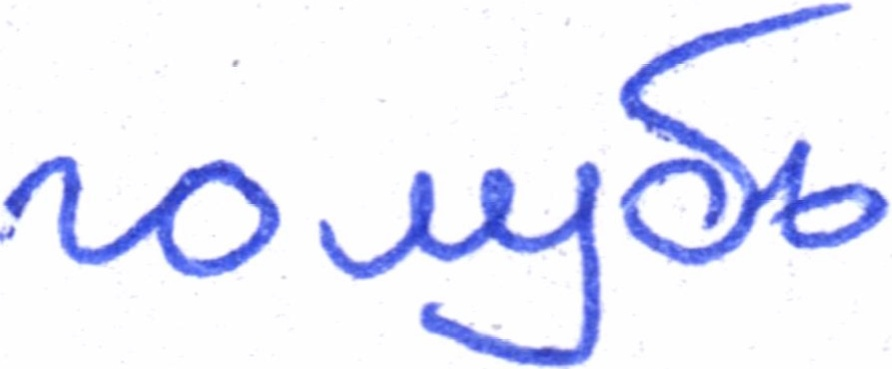голубь
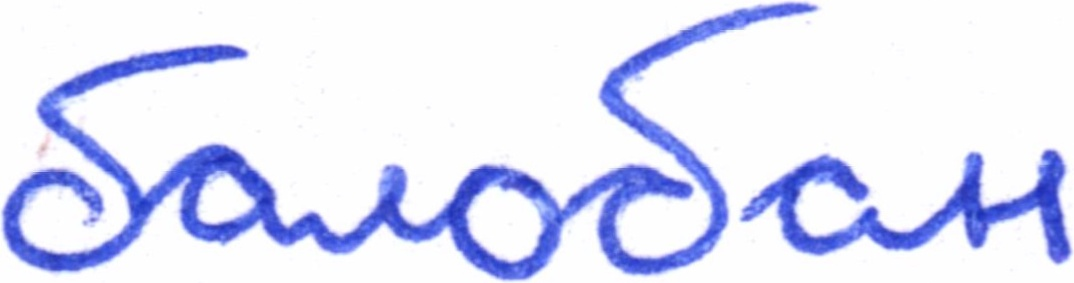балобан
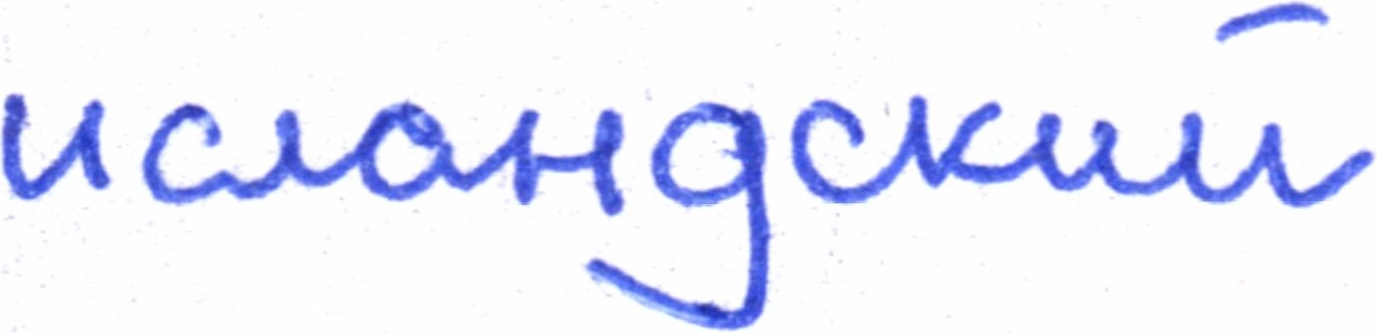исландский
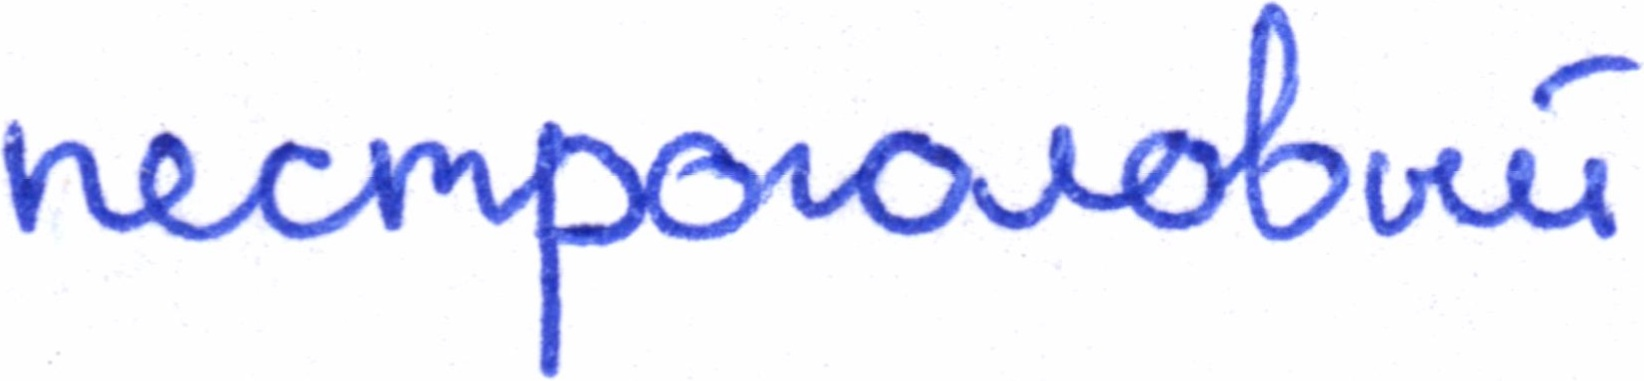пестроголовый
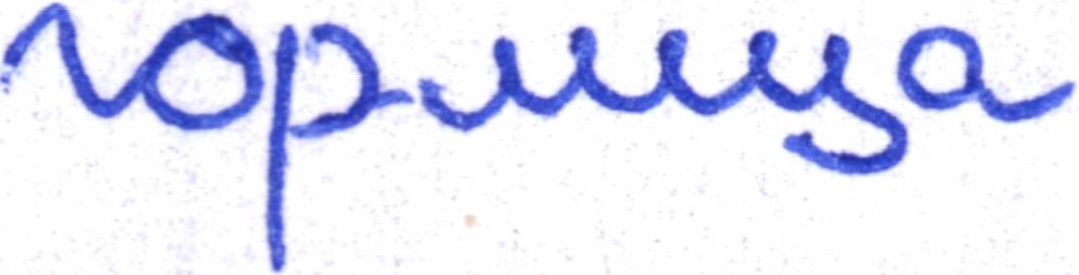горлица
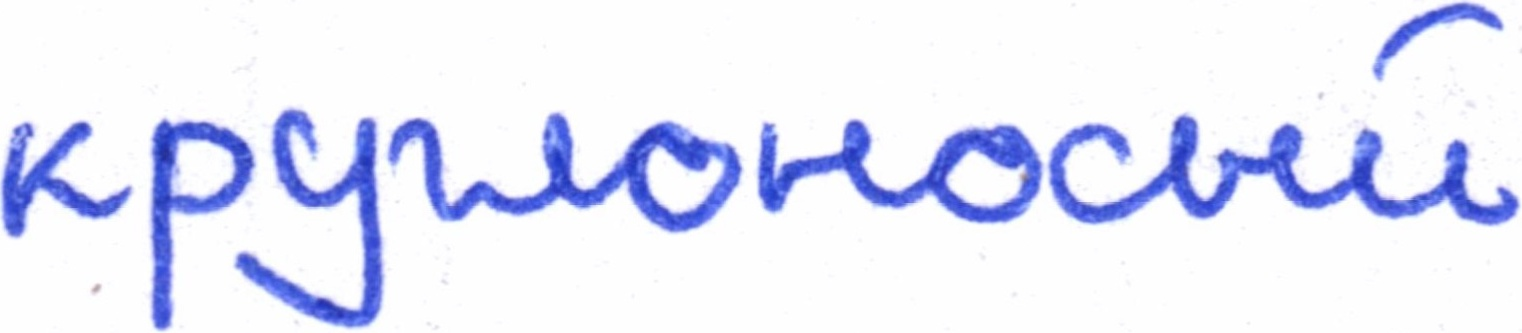круглоносый
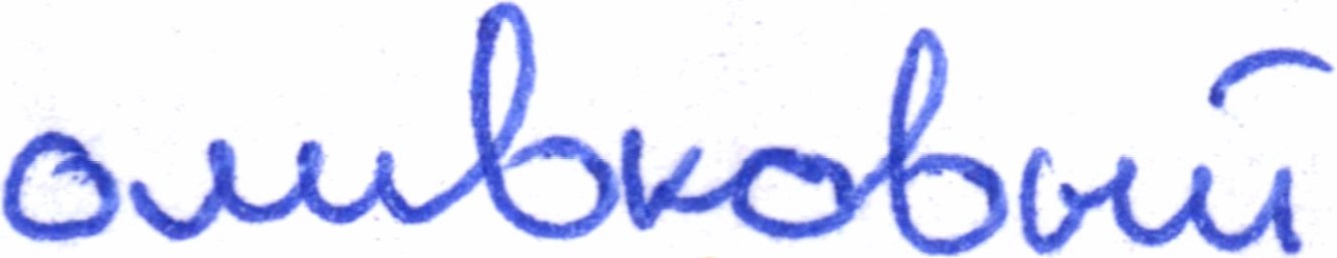оливковый
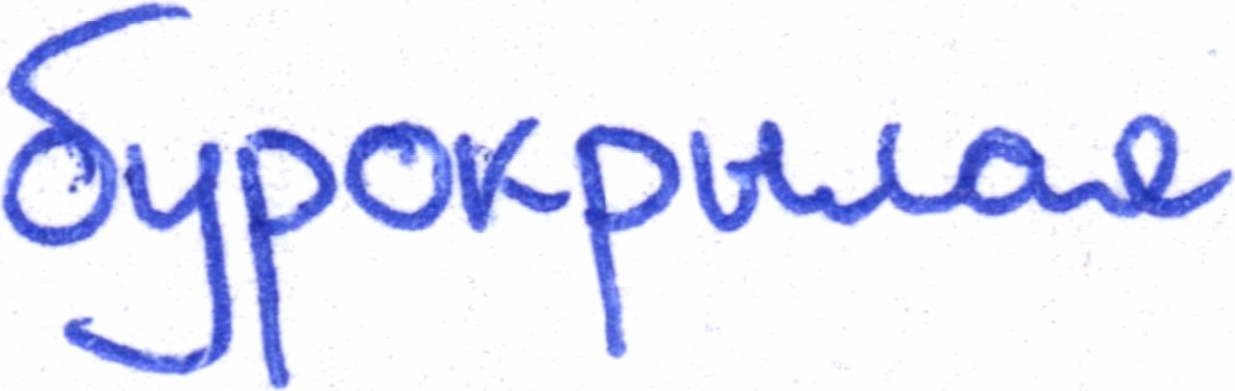бурокрылая
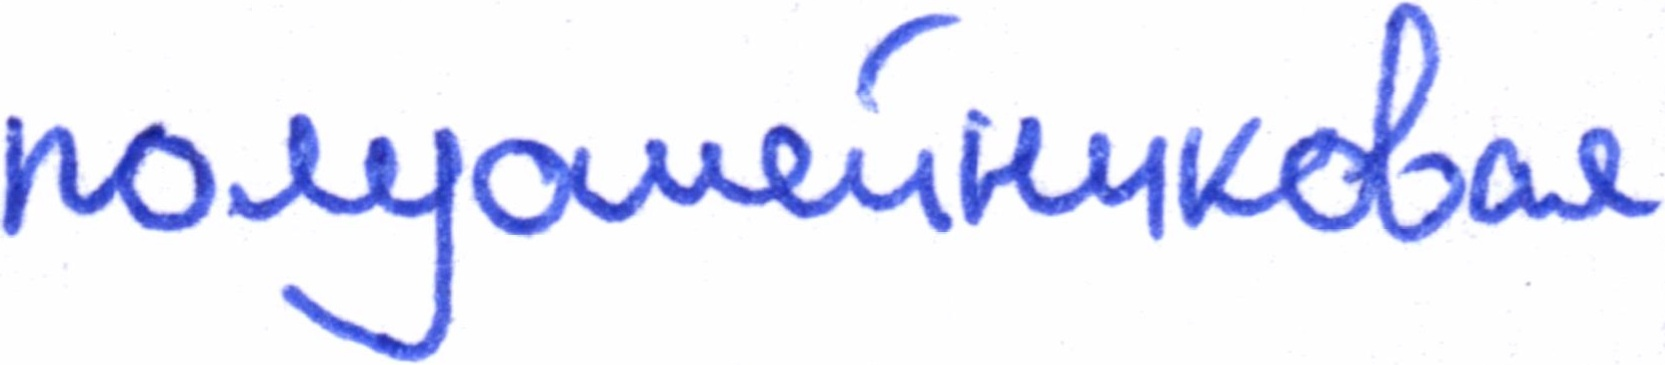полуошейниковая
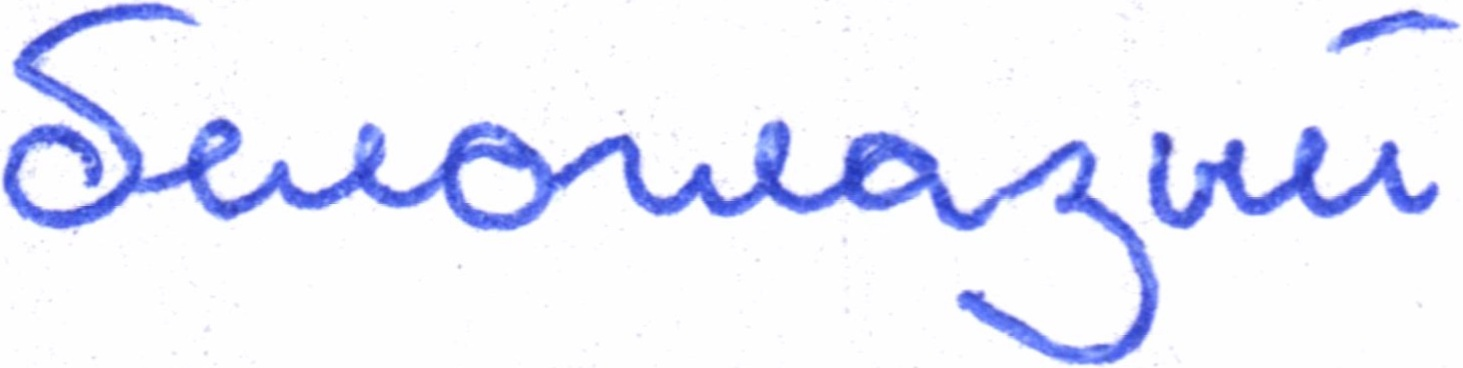белоглазый
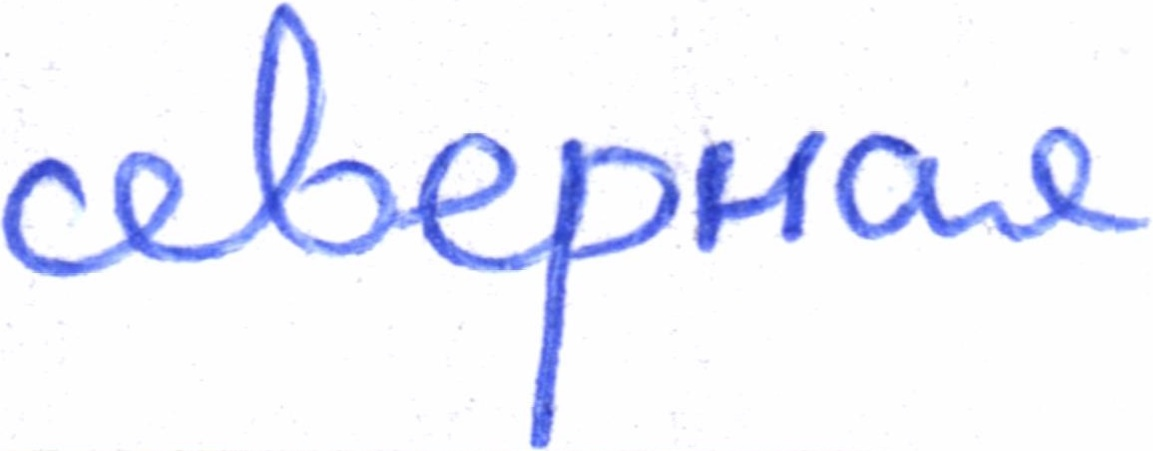северная
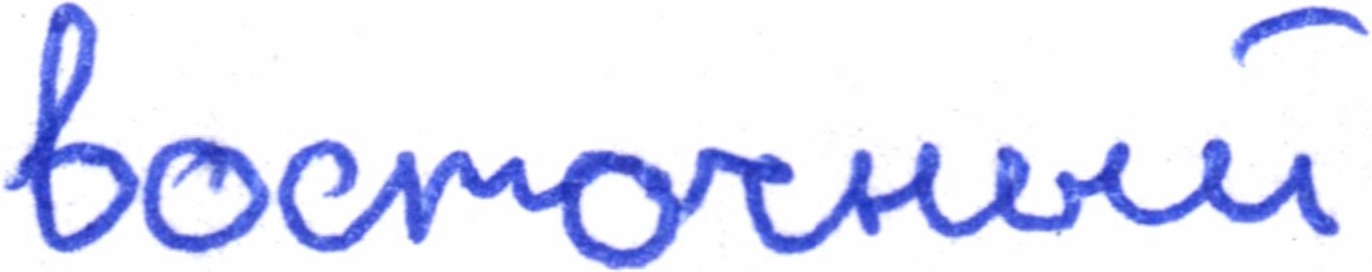восточный
